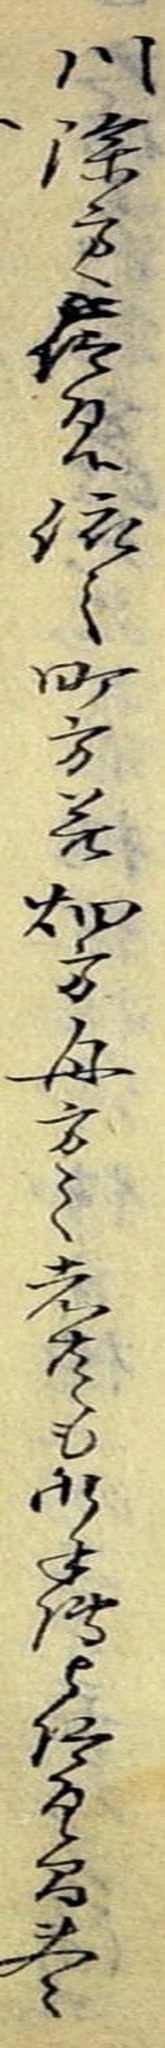川除方へ被仰付候依之町方并畑方舟方之者共へも御手伝被仰付候間夫々
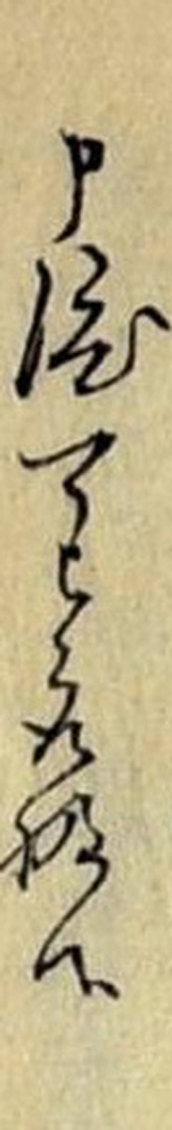申渡可被取扱候
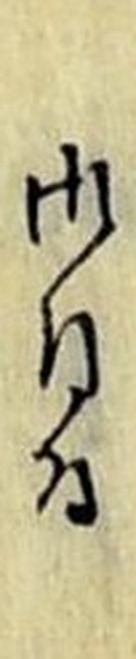御目付
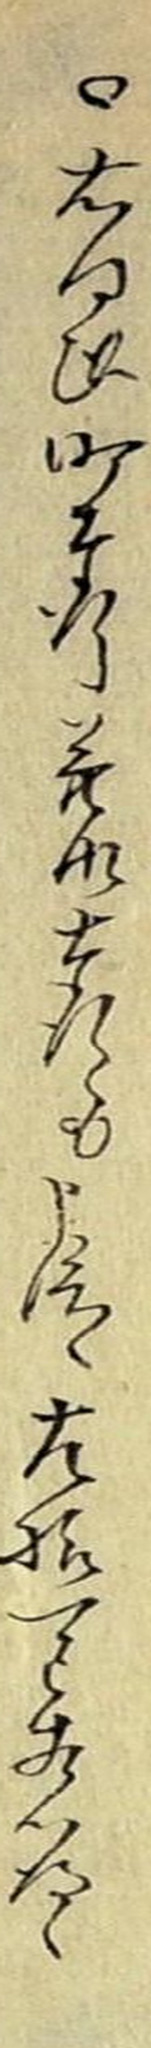○右同断町奉行并御奉行へも申渡候左様可被相心得候
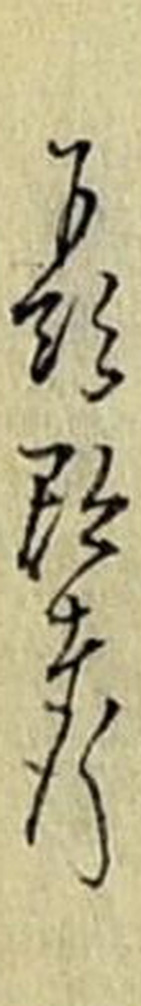下領郡奉行
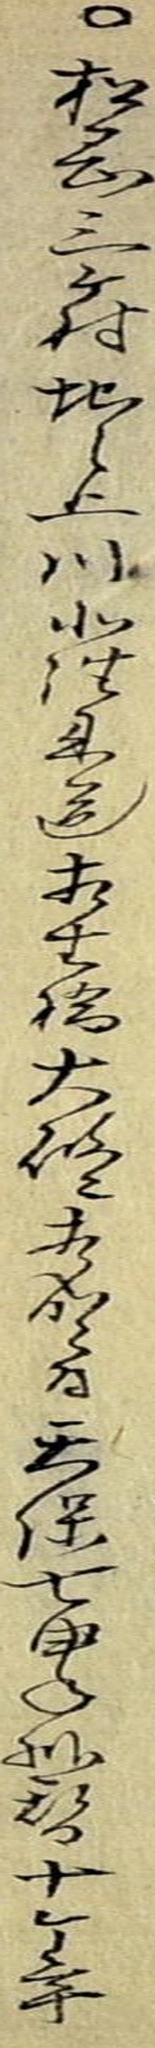○松岡三ヶ村地之上川北往来道相生橋大破に相成候に付天保七申年掛替十ヶ年
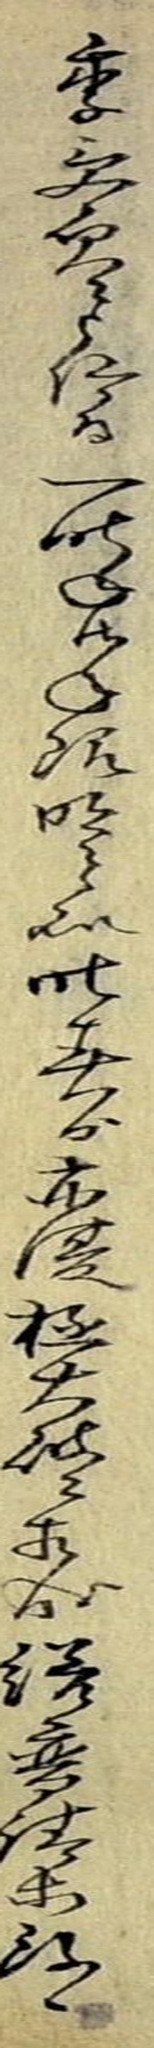季受負に被仰付一昨年御年限明に候処昨春ゟ亦復極大破に相成繕普請等致候
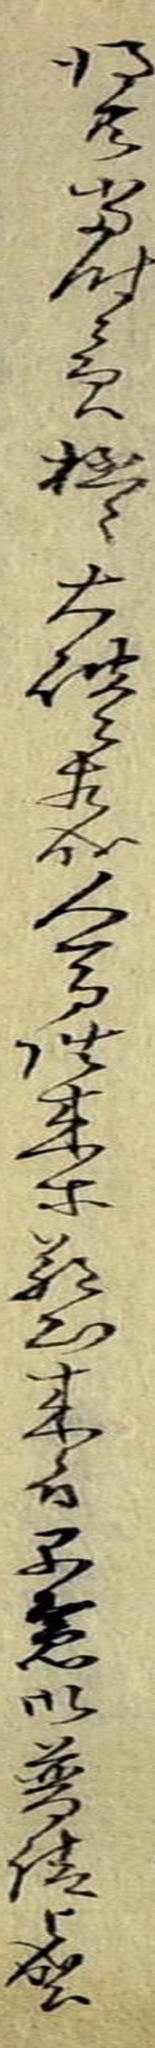得共当時に而は極々大破に相成人馬往来等難出来に付早急御普請被成下
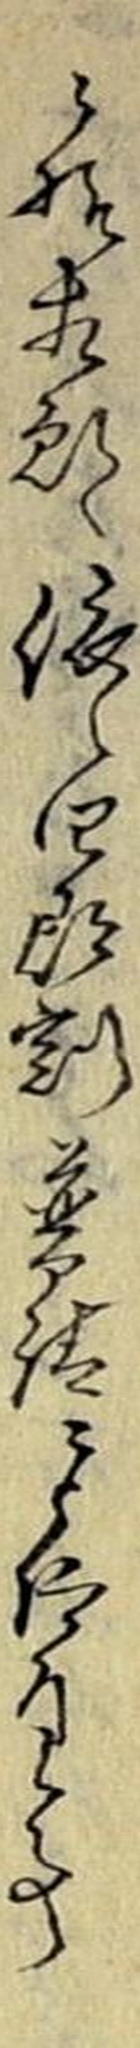候様相願候依之四郡割普請被仰付候事
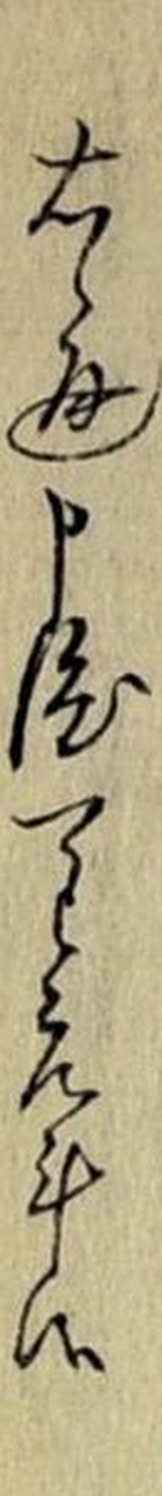右之通申渡可被取斗候
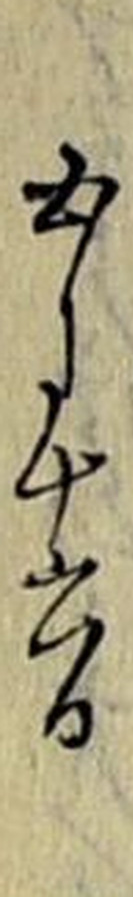五月十六日
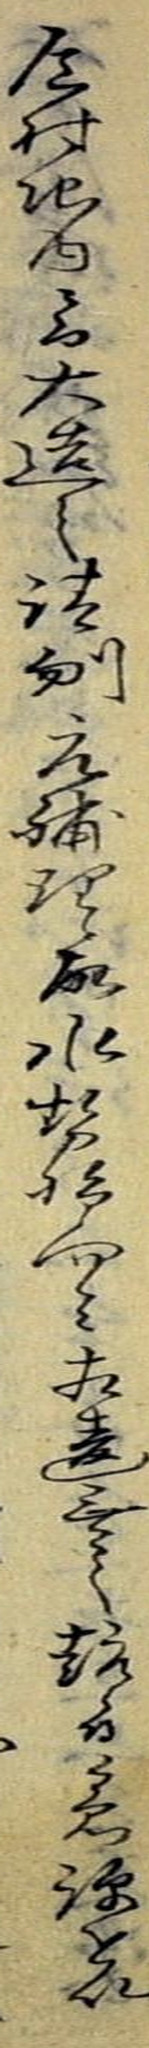底村地内に而大造之請刎取補理候故水勢指向に相違無之趣に付急評を以
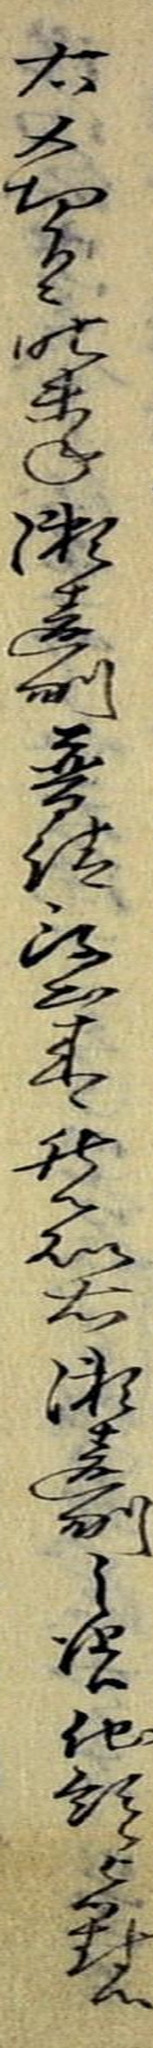右〆切下に昨未年瀬違刎普請致出来候然ル処右瀬違刎之儀は他領旨封候
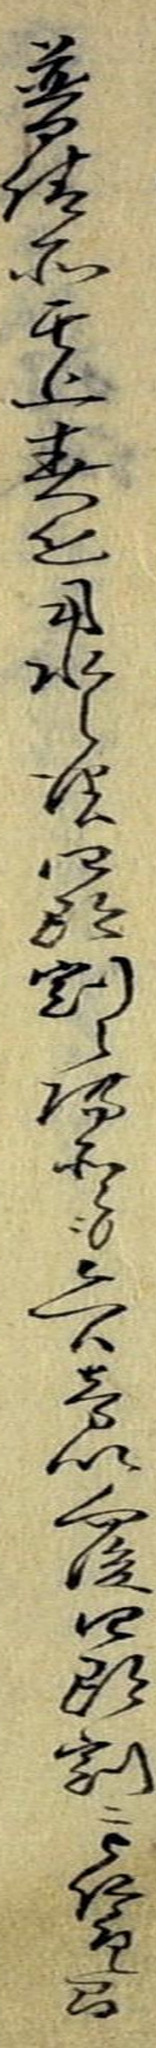普請所其上春近用水之儀は四郡割之場所にも候へは旁以向後四郡割被仰付候間
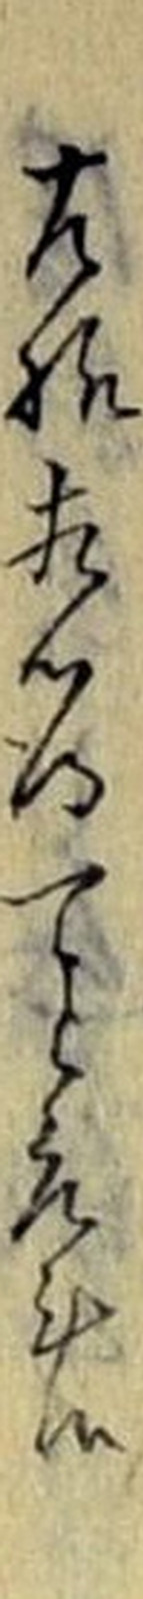左様相心得可被取斗候
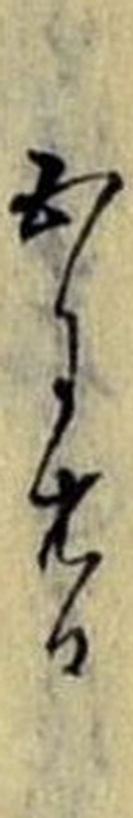五月廿日
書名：命令之部 六
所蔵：福井県文書館 Fukui Prefectural Archives
